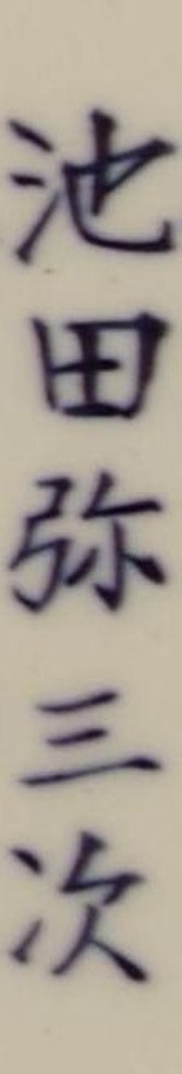池田弥三次
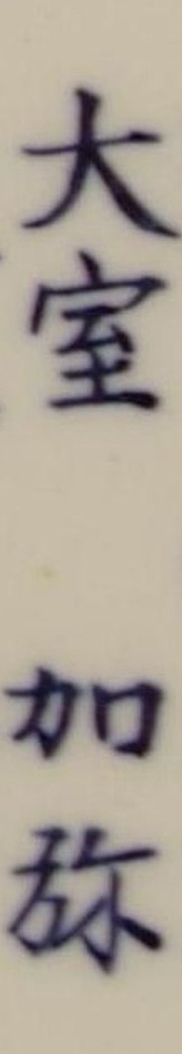大室加弥
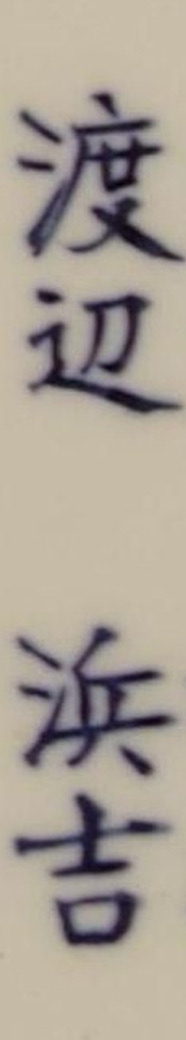渡辺浜吉
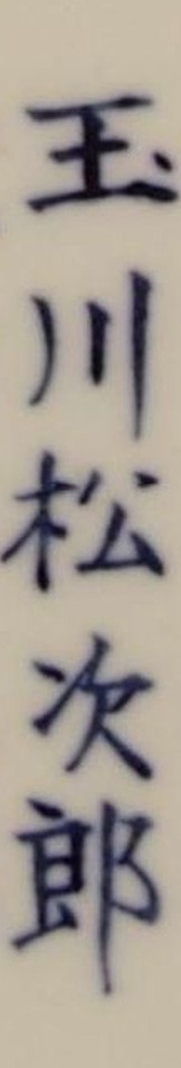玉川松次郎
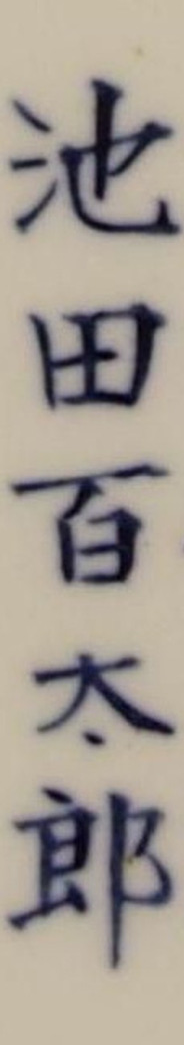池田百太郎
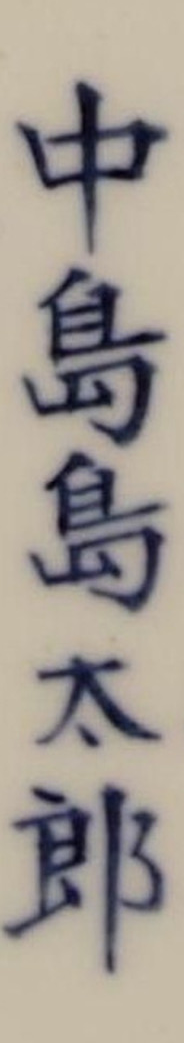中島島太郎
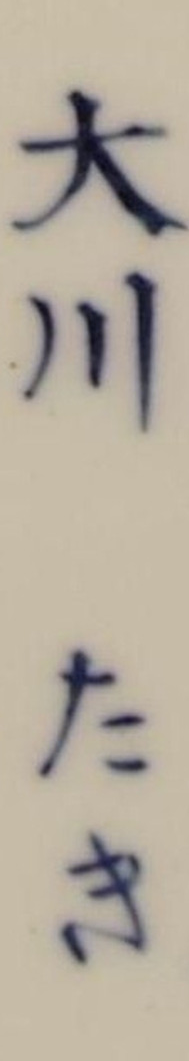大川たき
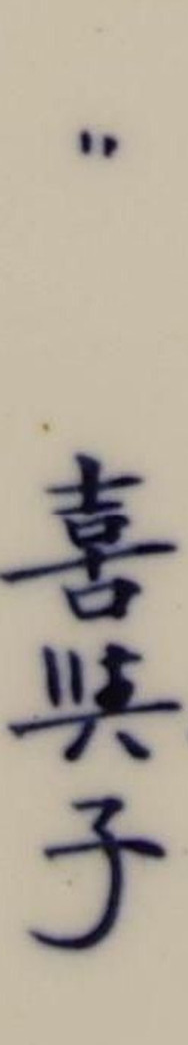喜与子
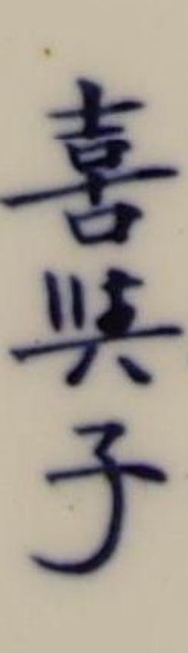喜与子
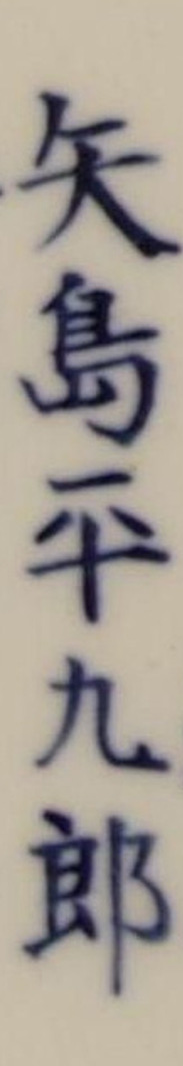矢島平九郎
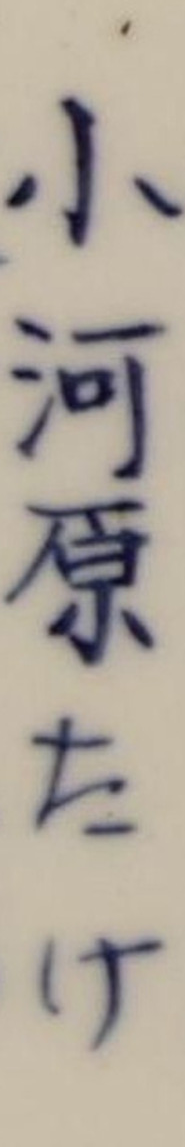小河原たけ
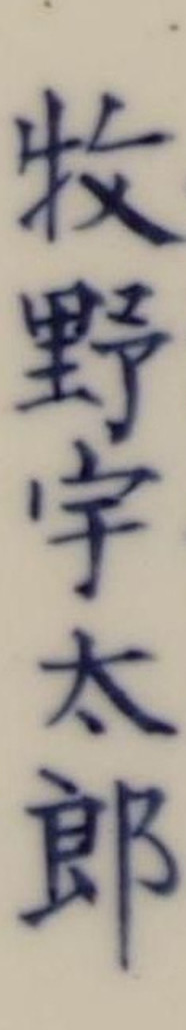牧野宇太郎
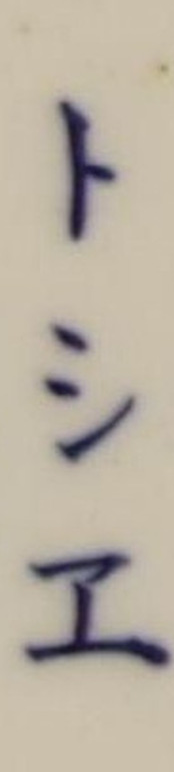トシエ

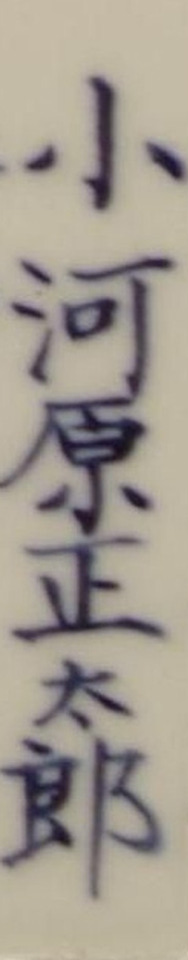小河原正太郎
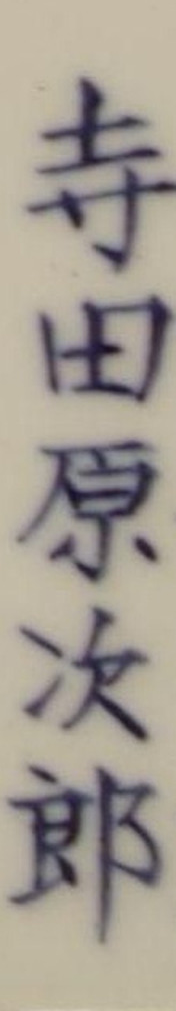寺田原次郎
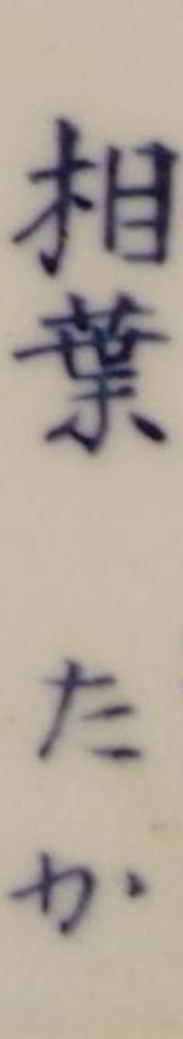相葉たか
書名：E~L
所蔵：高野山金剛峯寺
